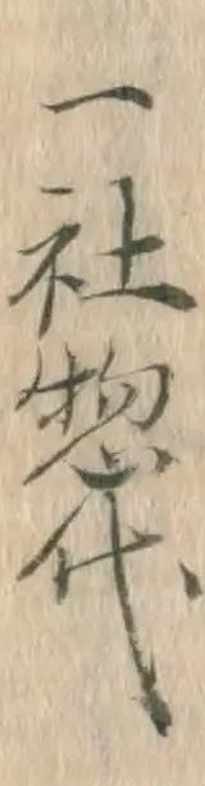一社惣代
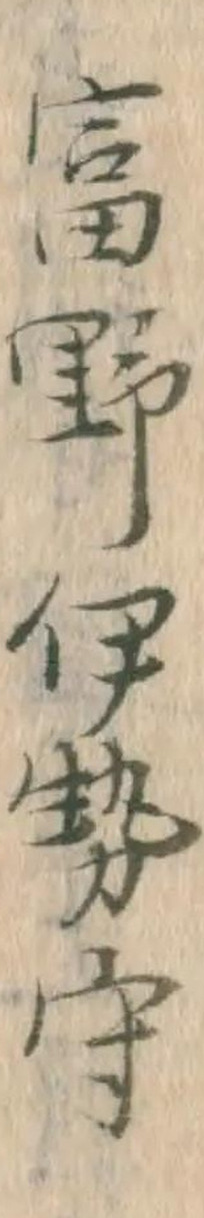冨野伊勢守
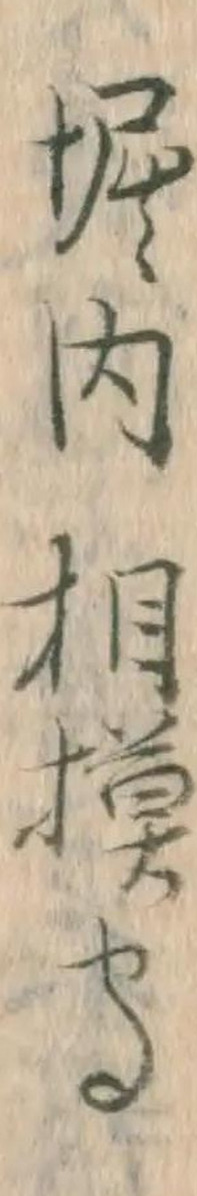堀内相模守
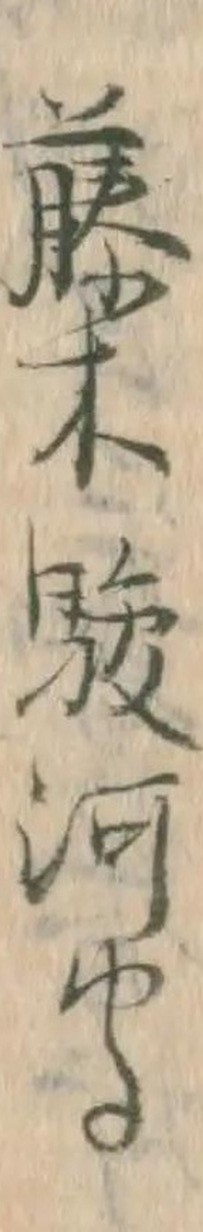藤木駿河守
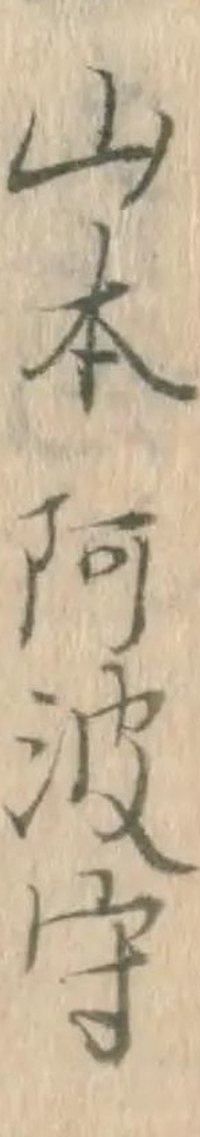山本阿波守
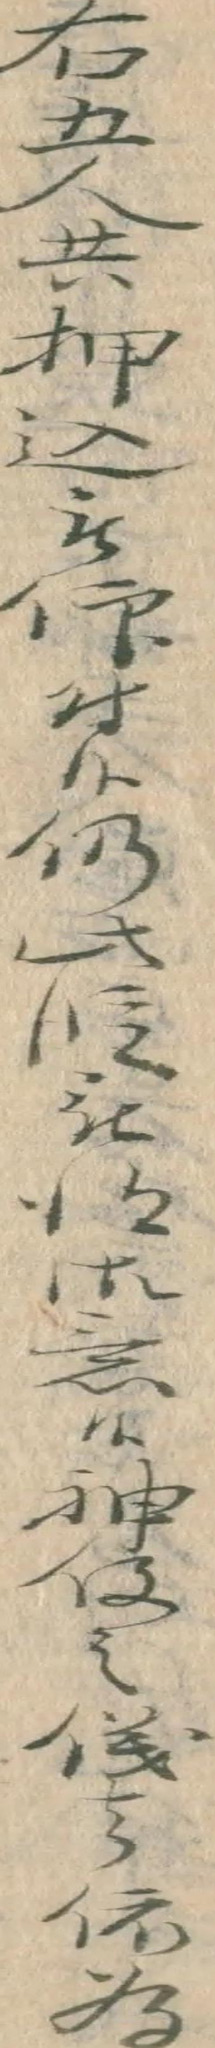右五人共押込被仰付候仍此段被得御意候神役之儀は依為
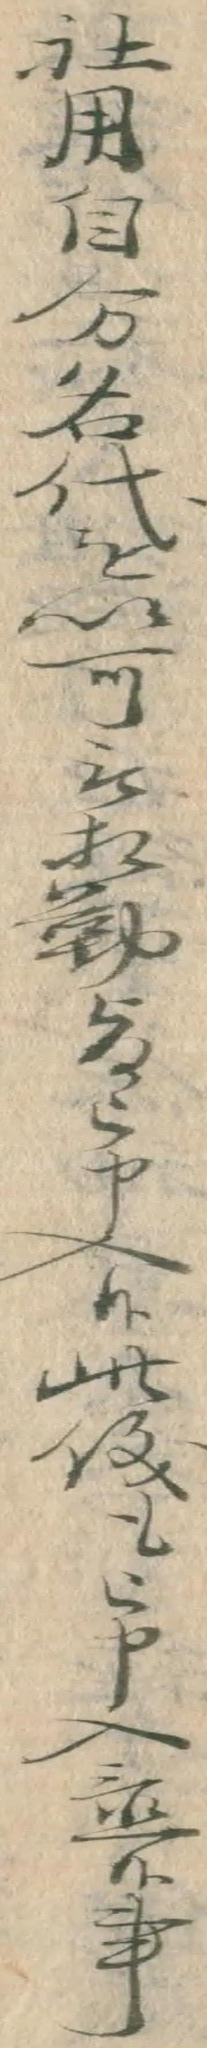社用自分名代を以可被相勤旨被申入候此儀も被申渡置候事
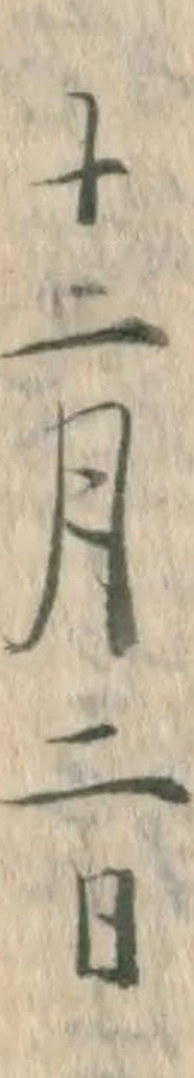十二月二日
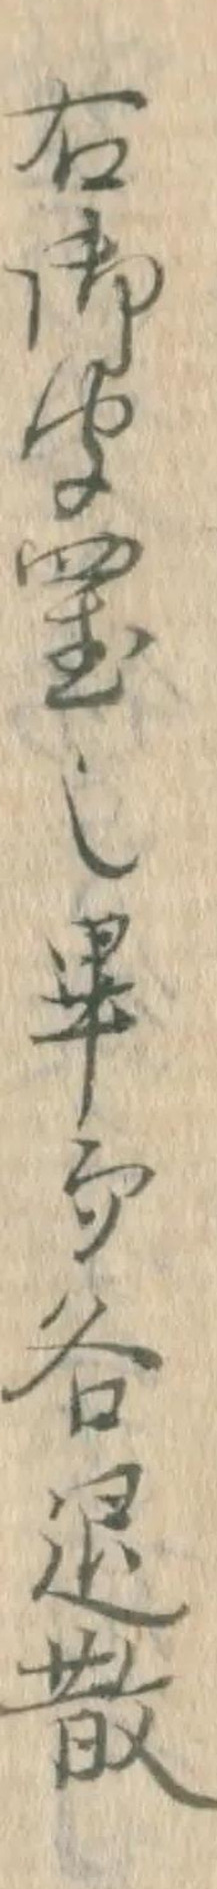右御聞置也畢而各退散
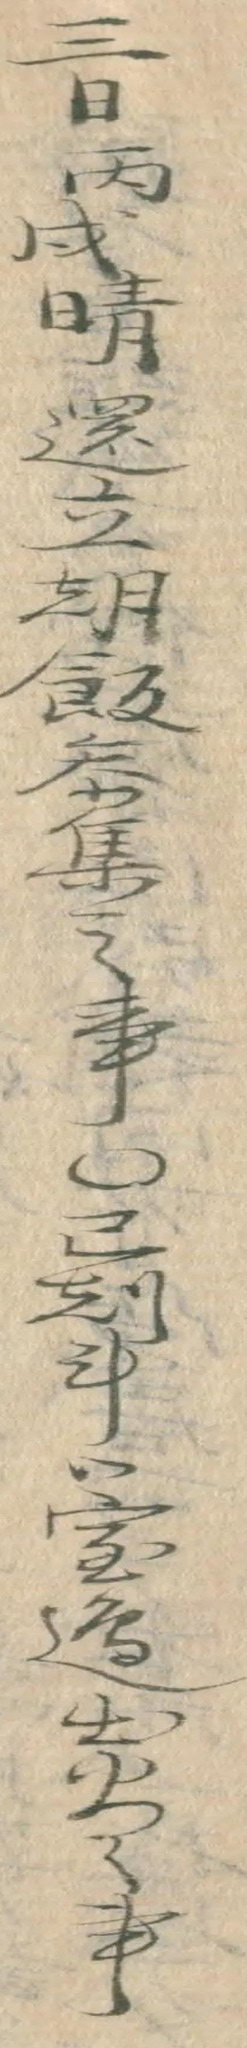三日丙戌晴還立朝飯参集之事○巳刻斗御宝邊出火之事
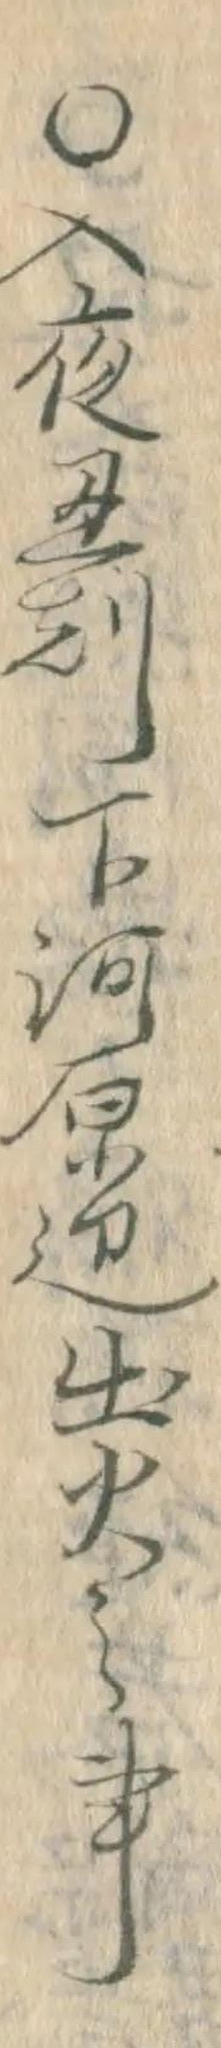○入夜丑刻下河原辺出火之事
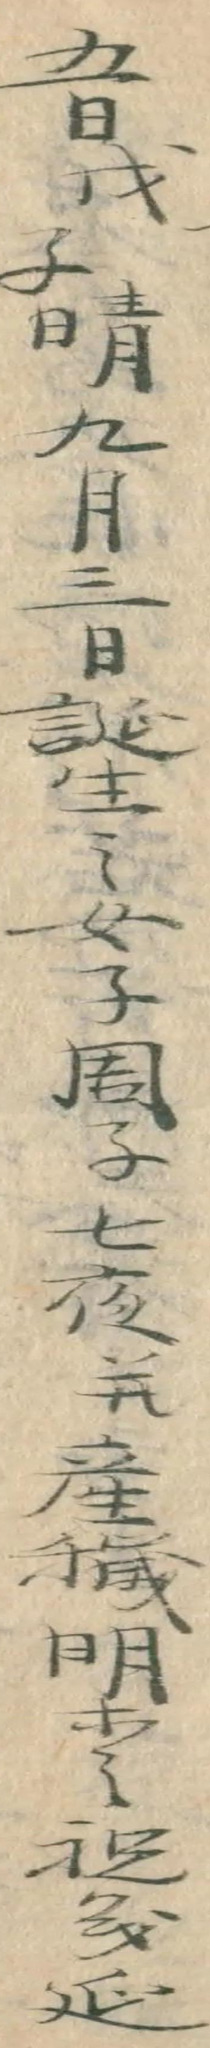五日戊子晴九月三日誕生之女子周子七夜并産穢明等之祝義延

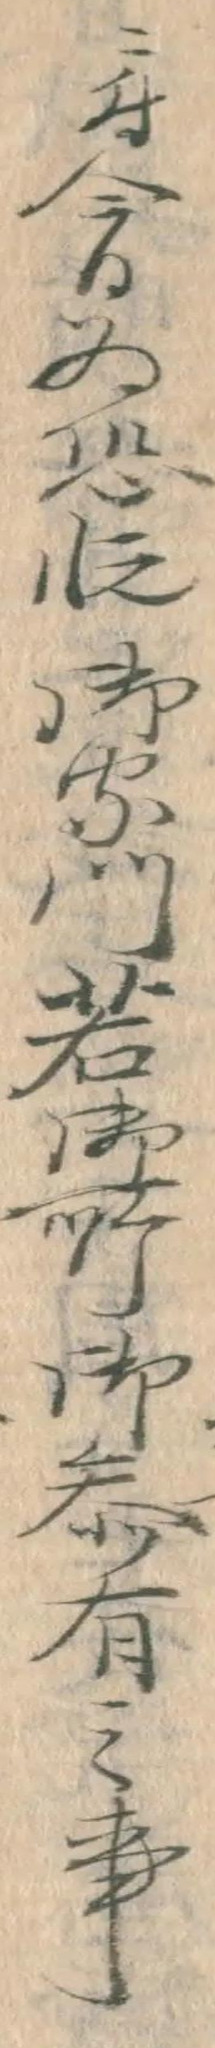ニ付今日為恐悦御家門若御所御参有之事
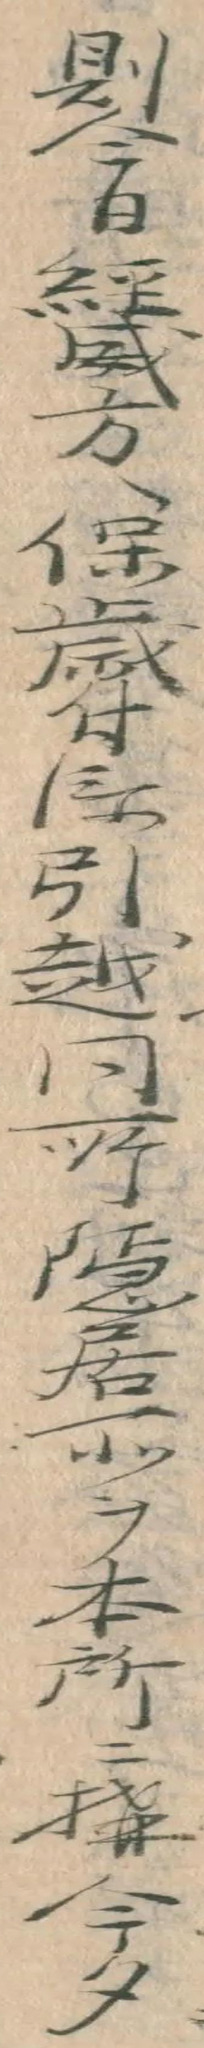則今日経威方へ保歳付添引越同所隠居所ヲ本所ニ構今夕
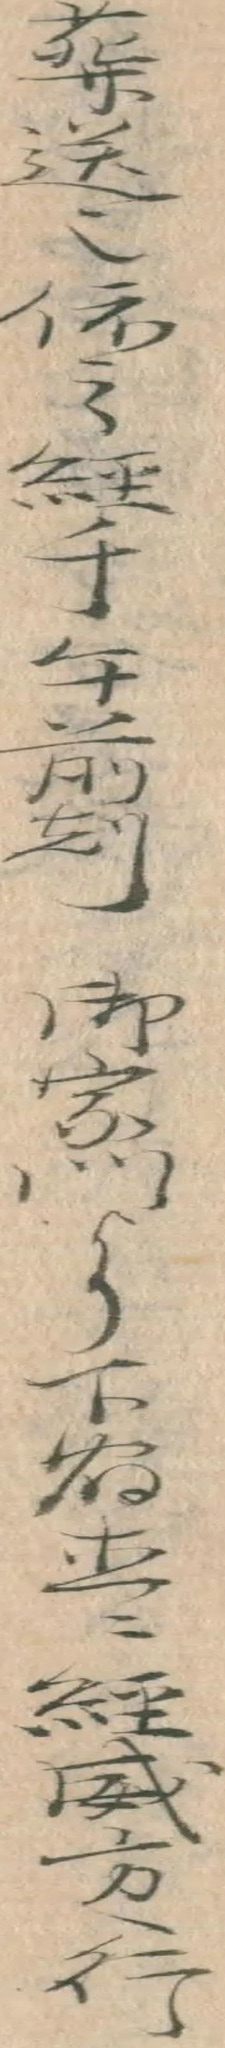葬送也依之経千午前刻御家門より下宿直ニ経威方へ行
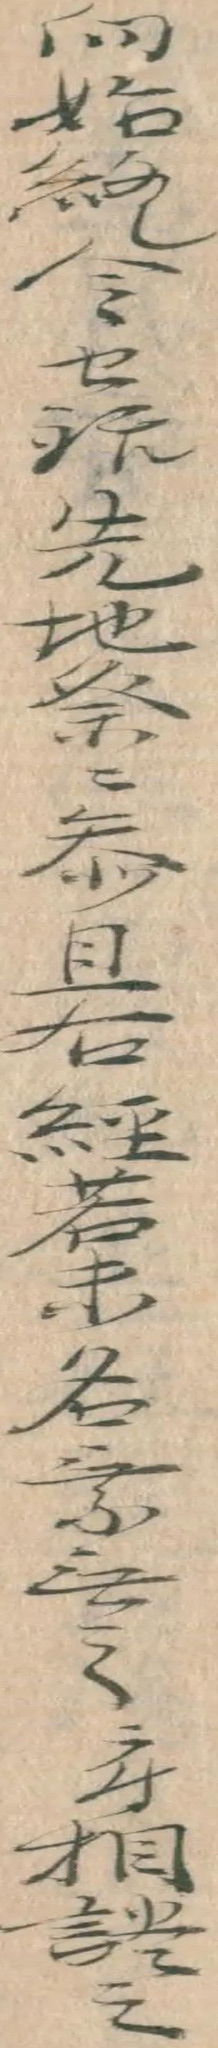向始終令世話先地祭に参且右経若未名乗無之ニ付相談之
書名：賀茂社記録. 第65冊
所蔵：国立国会図書館 National Diet Library, JAPAN
